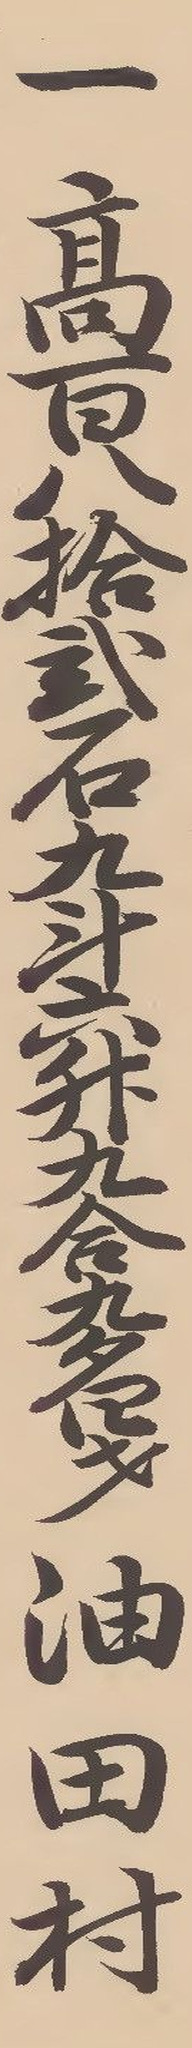一高百八拾弐石九斗六升九合九勺四才油田村
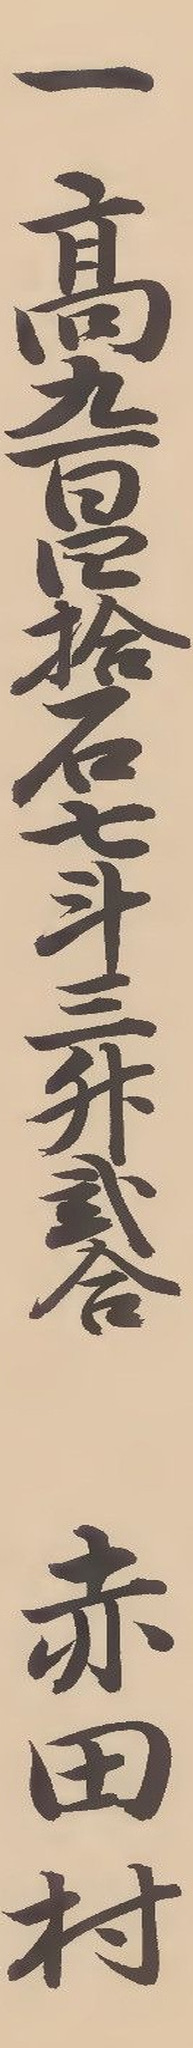一高九百四拾石七斗三升弐合赤田村
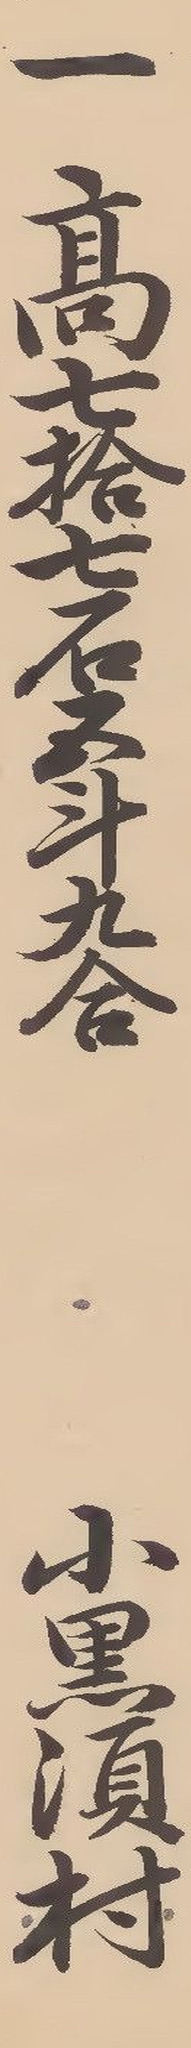一高七拾七石五斗九合小黒須村

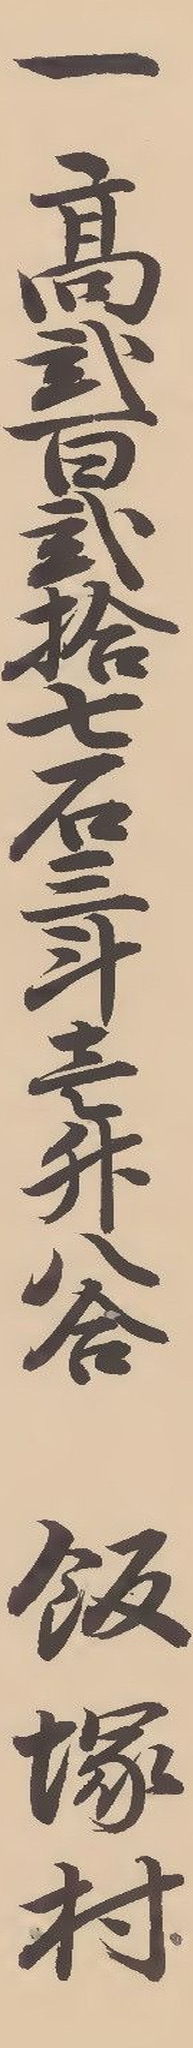一高弐百弐拾七石三斗壱升八合飯塚村
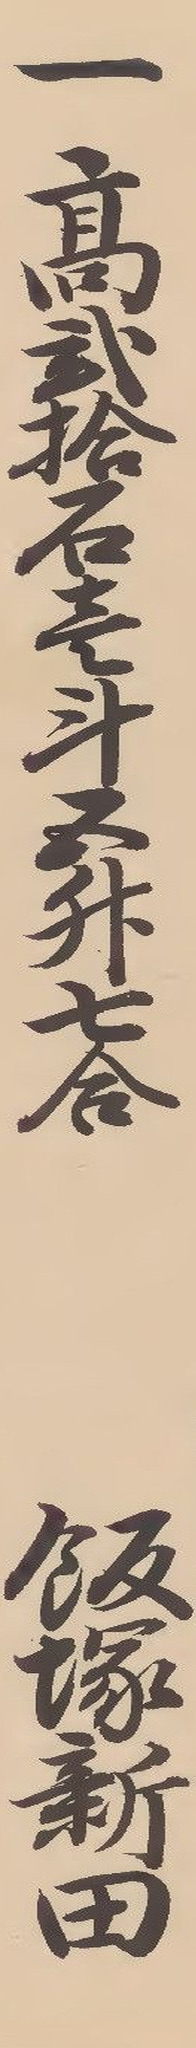一高弐拾石壱斗五升七合飯塚新田
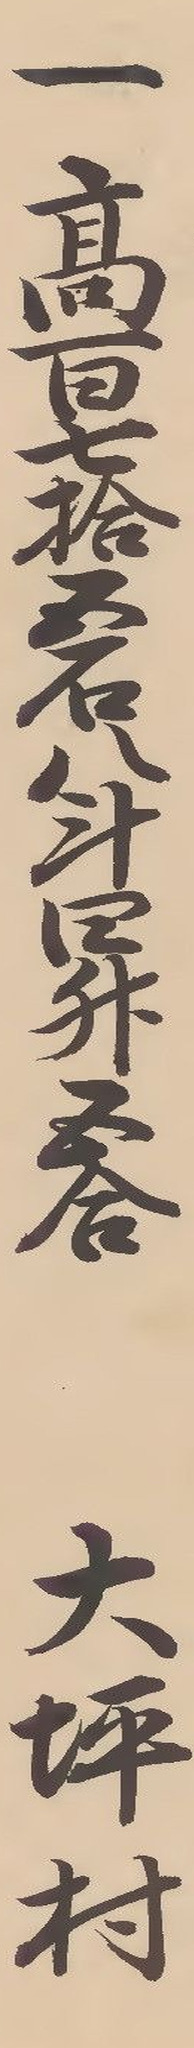一高百七拾五石八斗四升五合大坪村
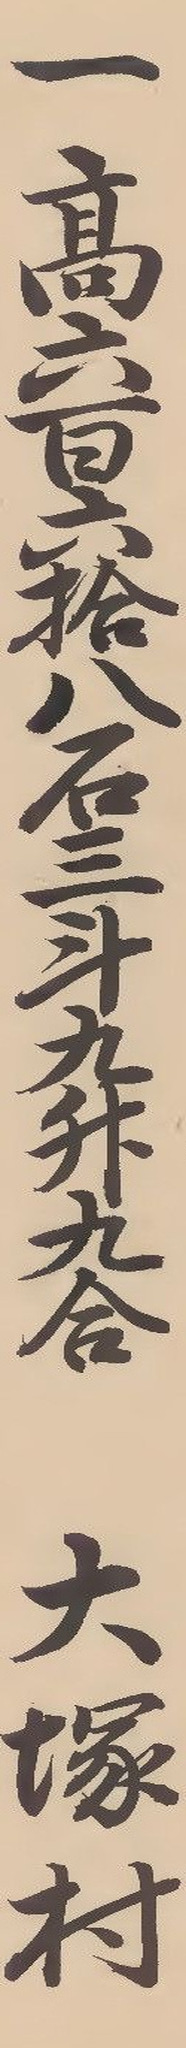一高六百六拾八石三斗九升九合大塚村
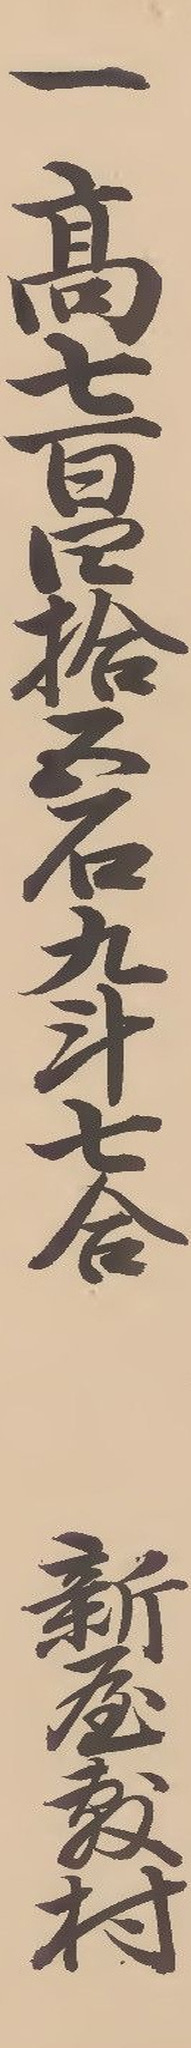一高七百四拾五石九斗七合新屋敷村
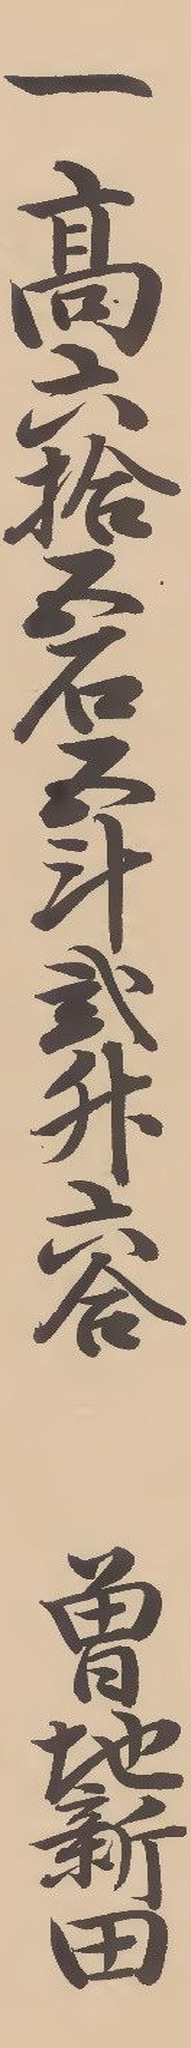一高六拾五石五斗弐升六合曽地新田
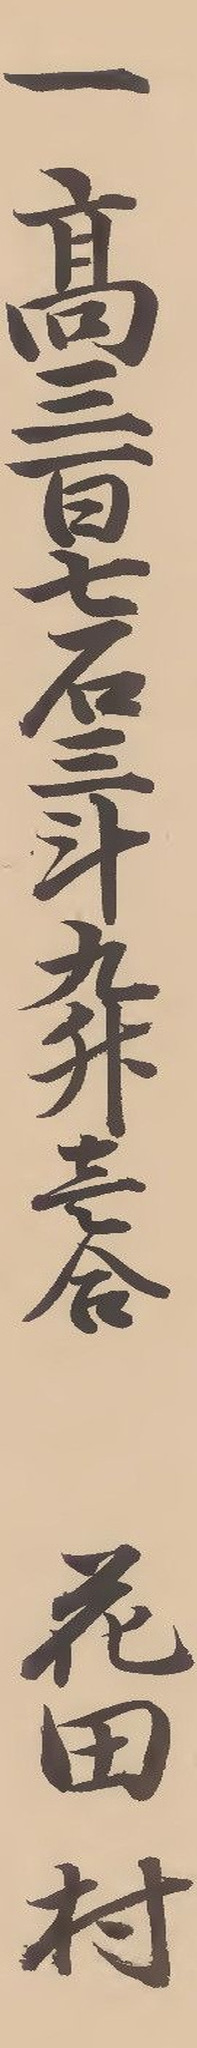一高三百七石三斗九升壱合花田村
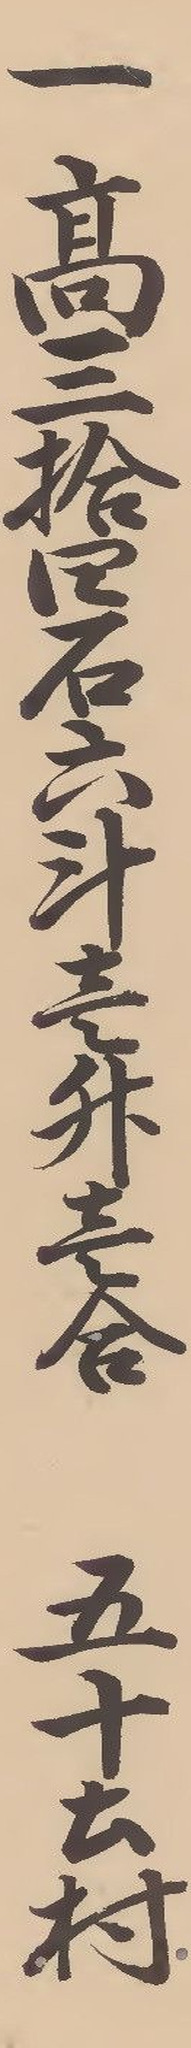一高三拾四石六斗壱升壱合五十土村

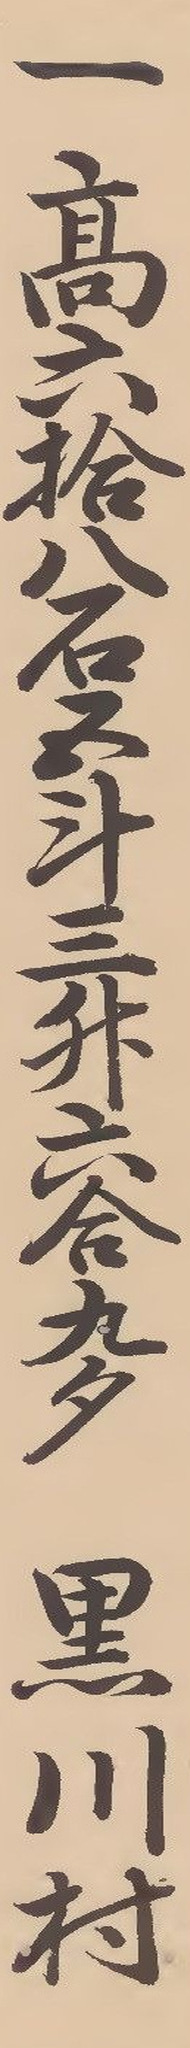一高六拾八石五斗三升六合九勺黒川村
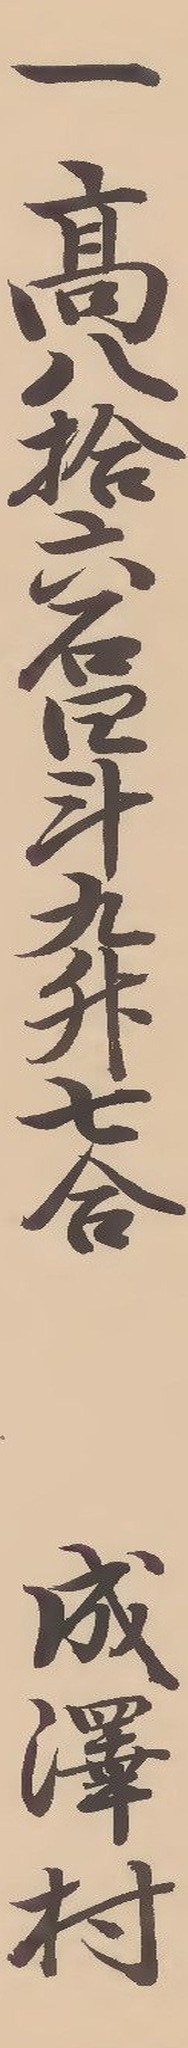一高八拾六石四斗九升七合成沢村
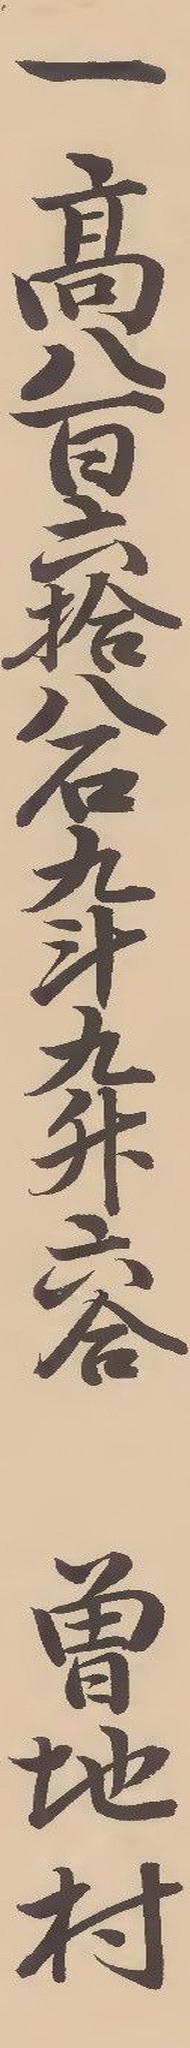一高八百六拾八石九斗九升六合曽地村
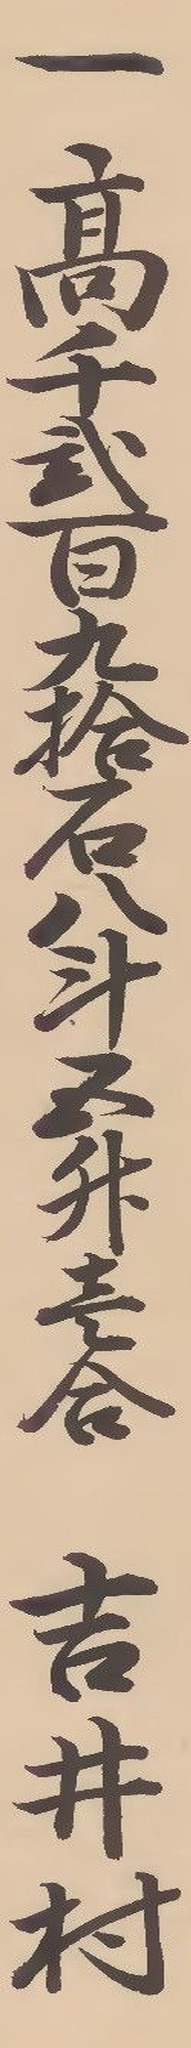一高千弐百九拾石八斗五升壱合吉井村
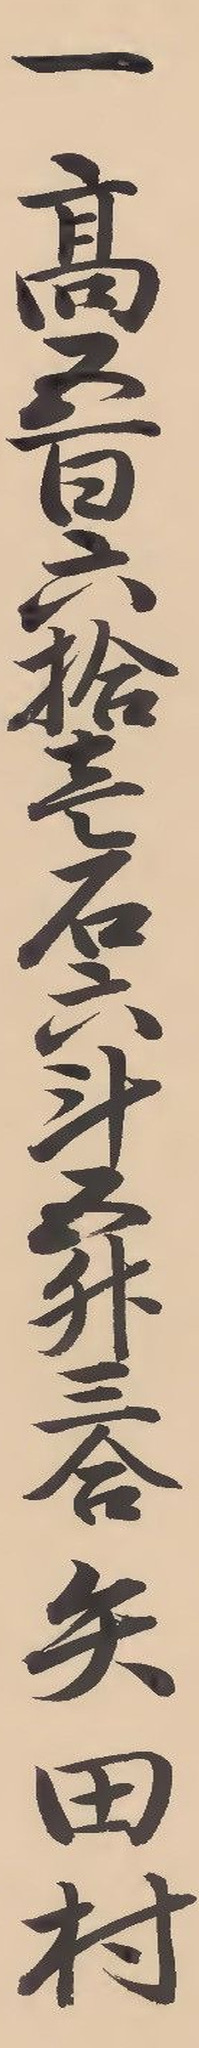一高五百六拾壱石六斗五升三合矢田村
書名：越後国郷帳　中
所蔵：国立公文書館 National Archives of Japan
